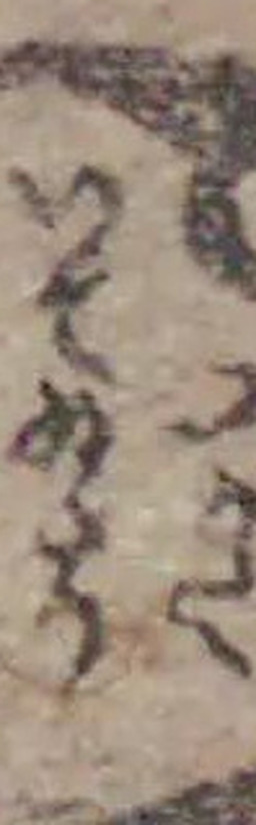いてめたか
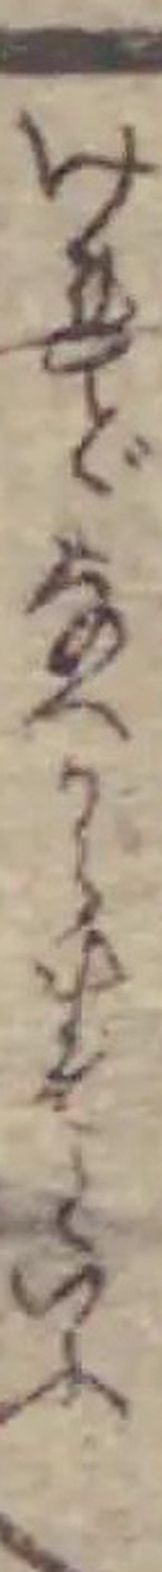けれどなへからまてといふ
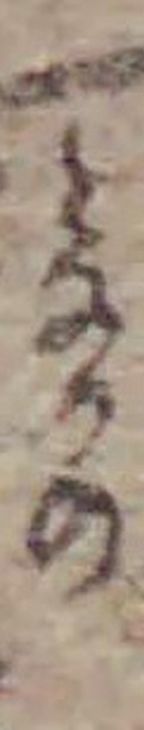となりの
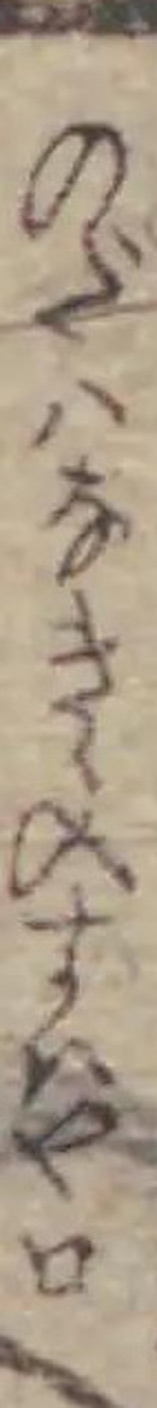のだはなきゝ入すはや口
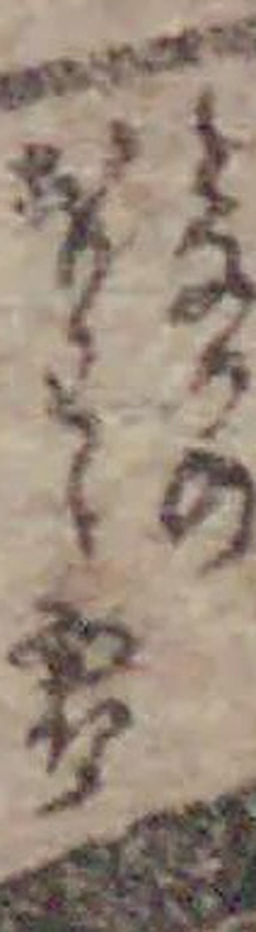おもわし女ほう
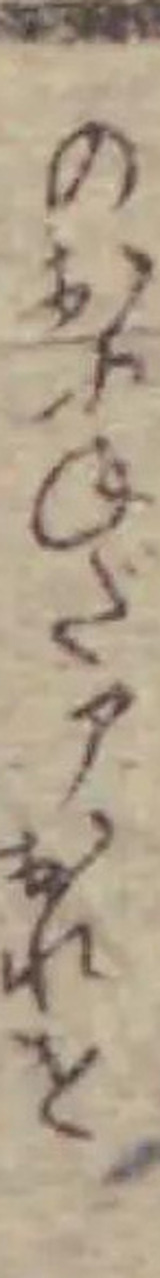のおふねだアおれを
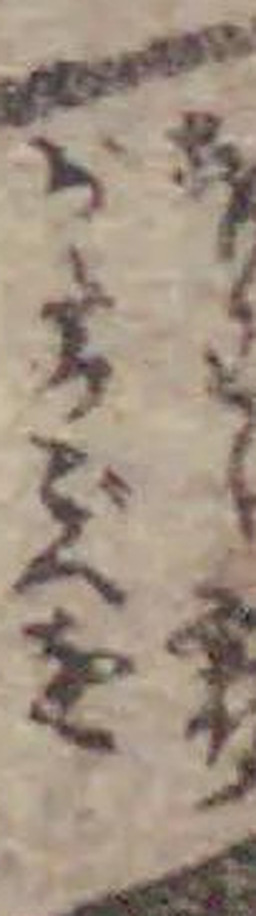がたかごへを
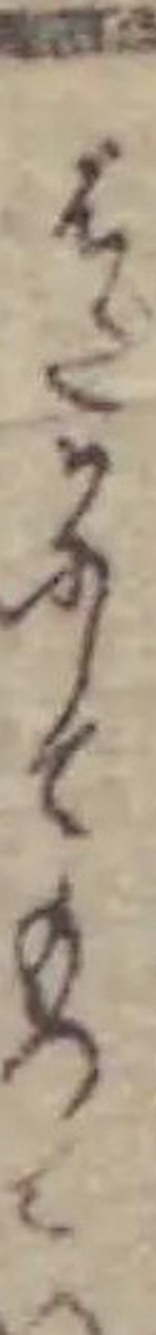はだかにしてもつてい
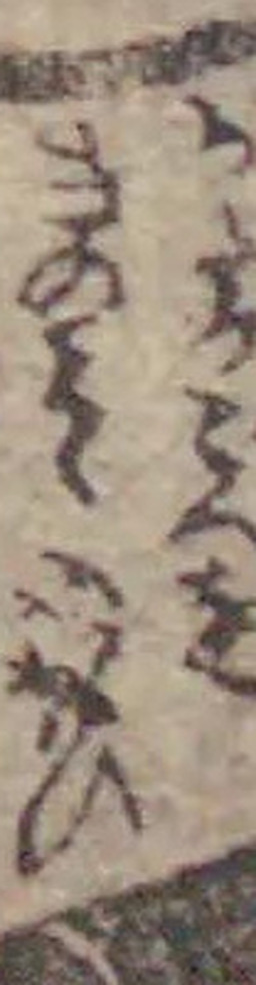きのとくにおもひ
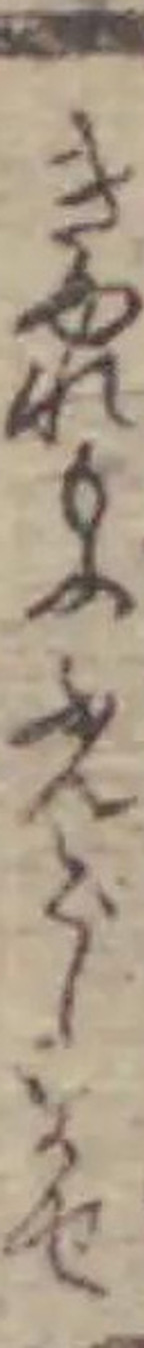きやれもふふんどしませ
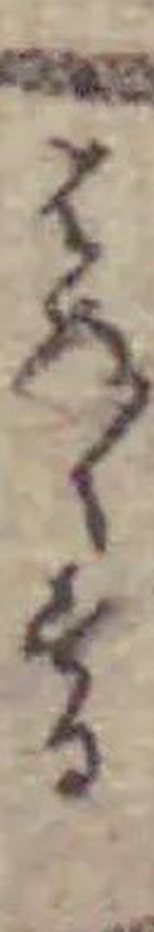はら〳〵する
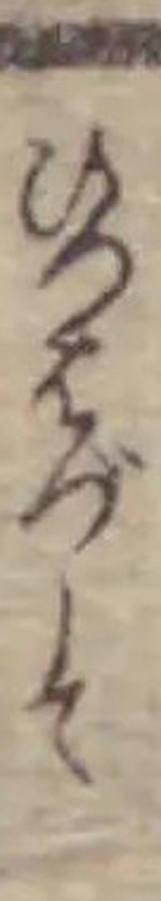ひつはずして
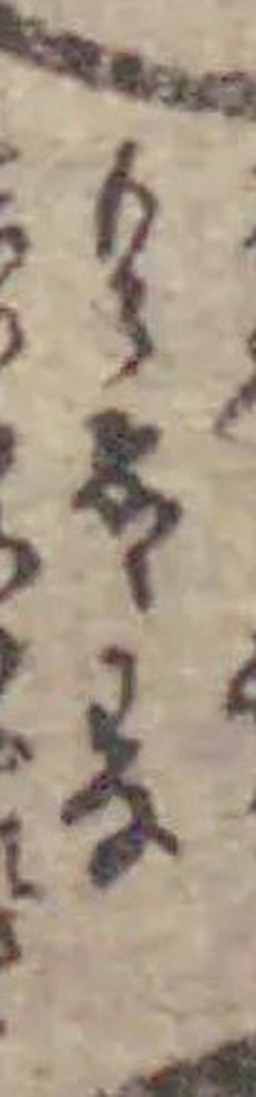もうゑゝわな
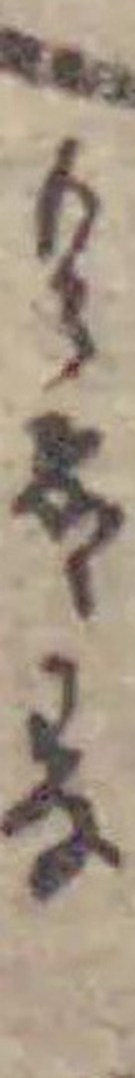もうゑゝわな
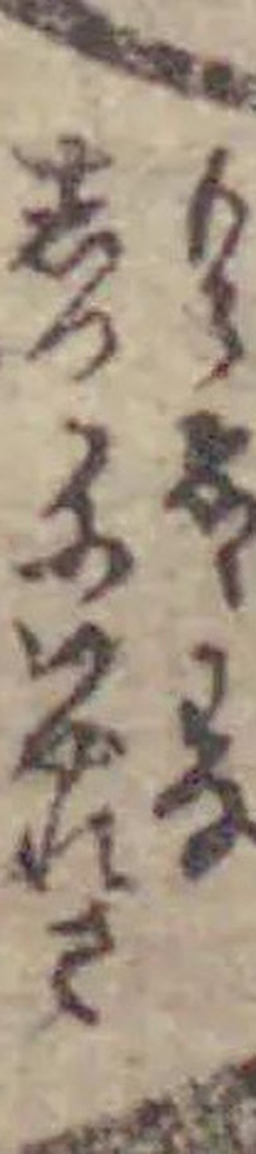しつかにいやれさ
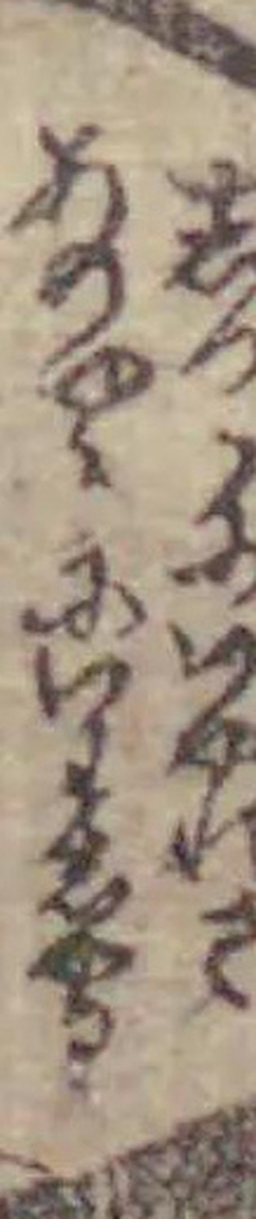あのやうにいわしやる
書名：飛た間違矢口噂 2巻
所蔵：国立国会図書館 National Diet Library, JAPAN
